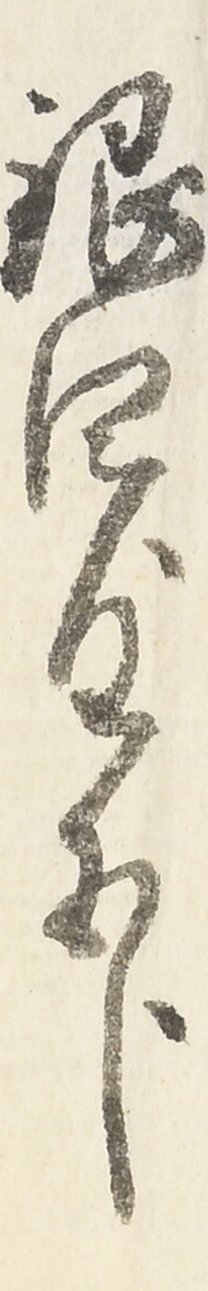銀四匁五分
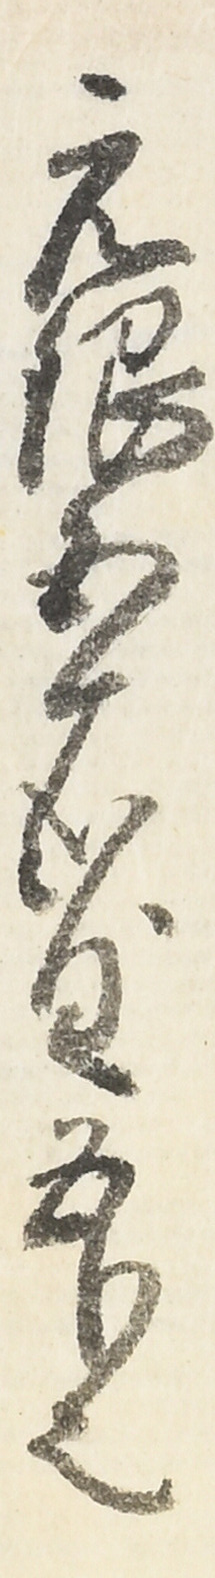元銀五十弐匁五分也
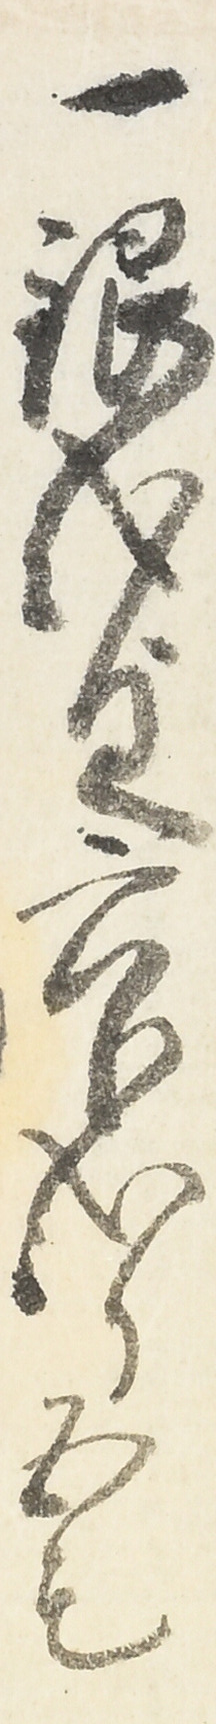一銀弐匁六分弐厘五毛
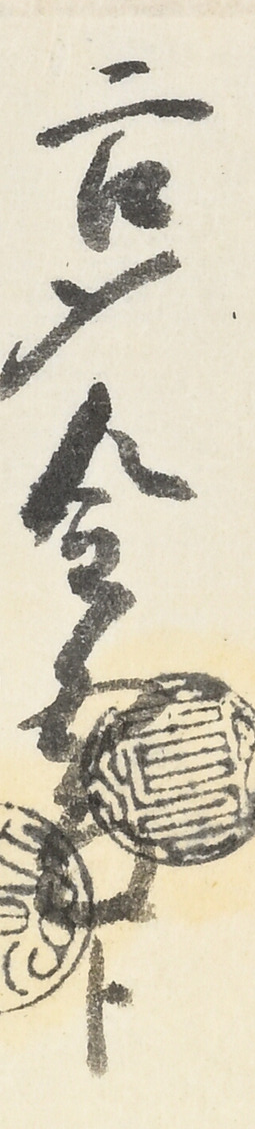二口〆金五両ト
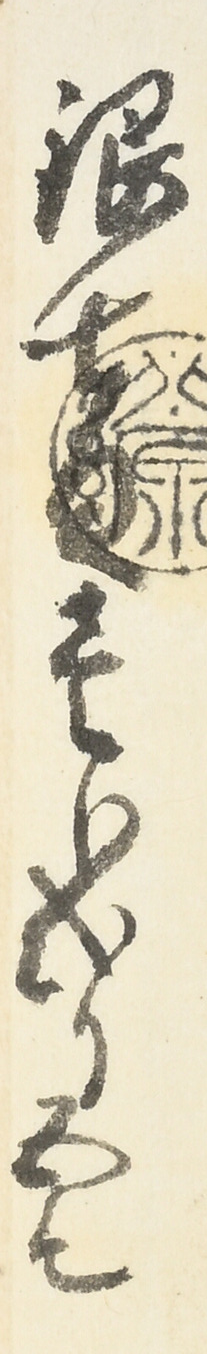銀七匁壱分弐厘五毛
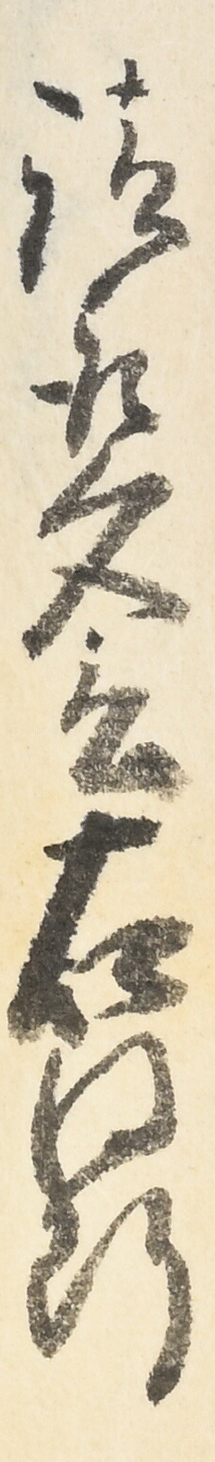請取文言右同断

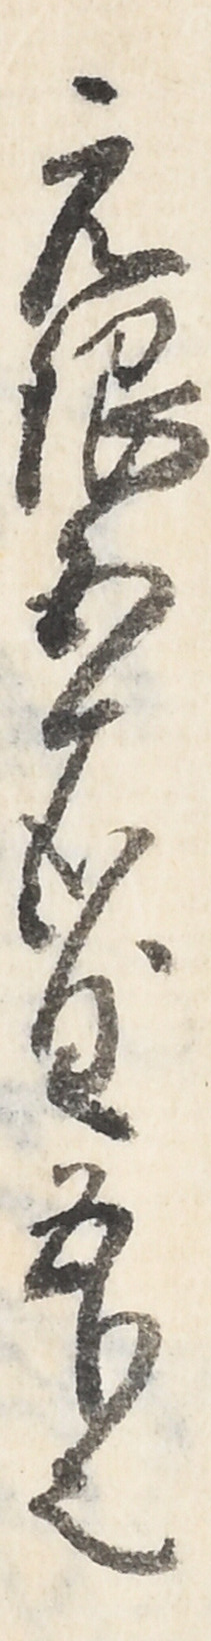元銀五拾匁五分也
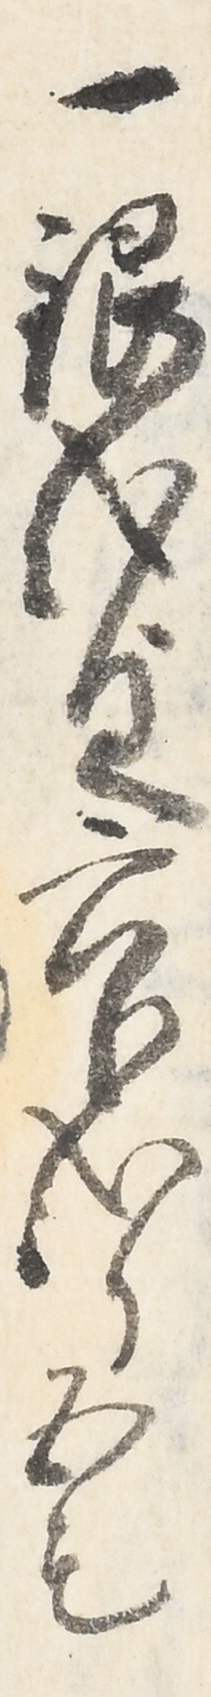一銀弐匁五分弐厘五毛
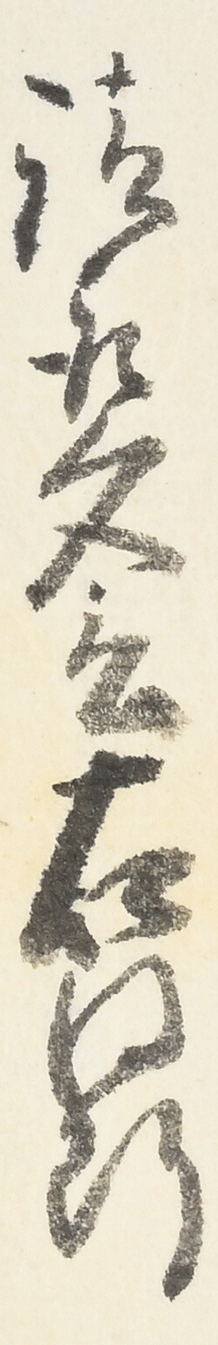請取文言右同断
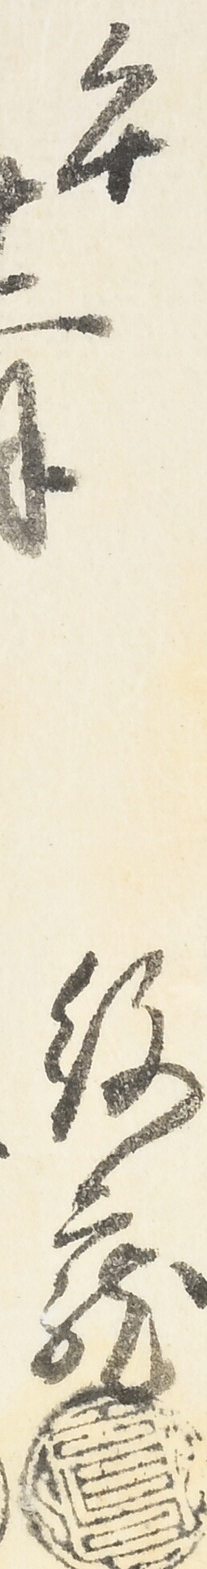十二月勝蔵
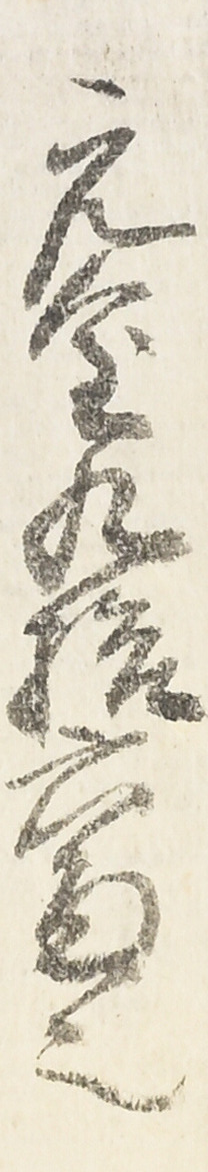元金九拾六両也
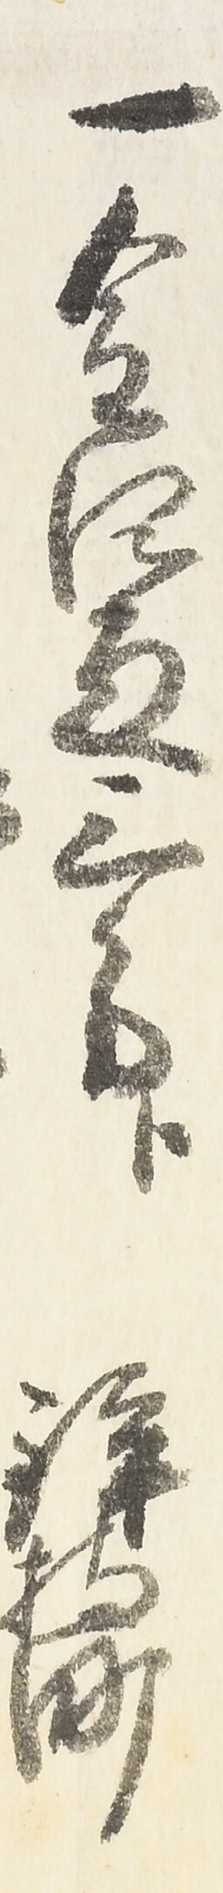一金四両三分ト鉾持町
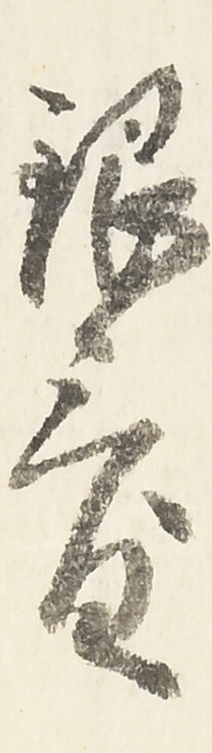銀三匁
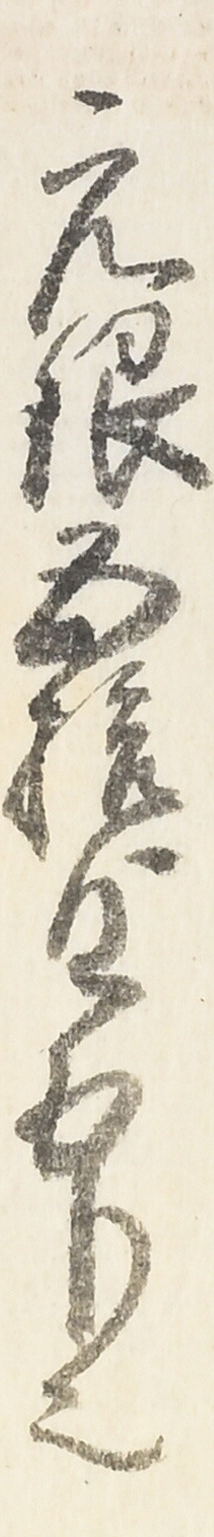元銀五拾匁五分也
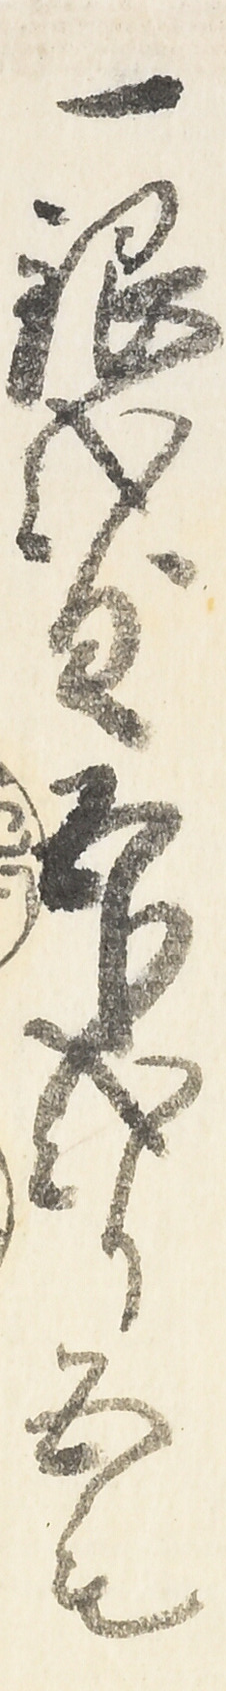一銀弐匁五分弐厘五毛
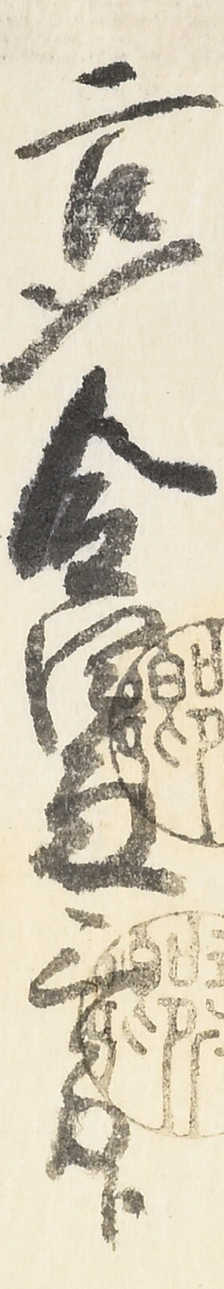二口〆金四両三分ト
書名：御才覚金御利足割渡扣帳
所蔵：伊那市立高遠町図書館・合同会社AMANE
